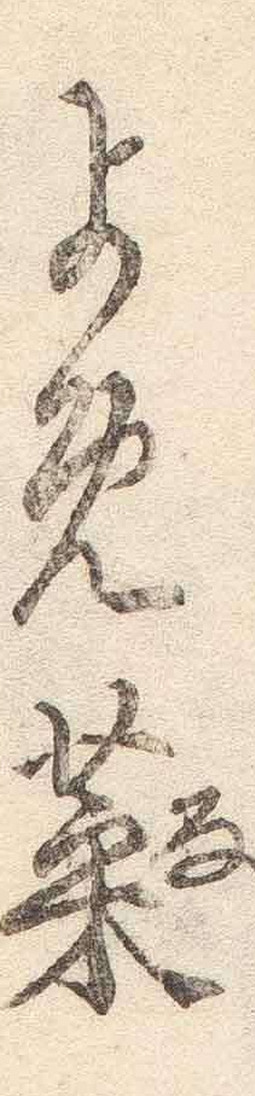よめ菜
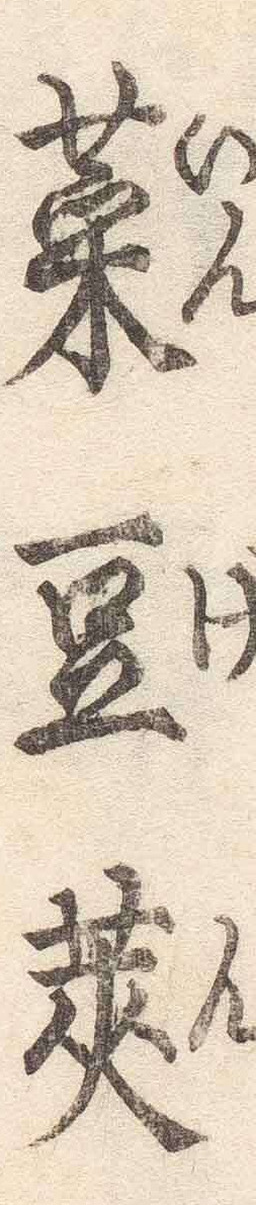菜豆莢
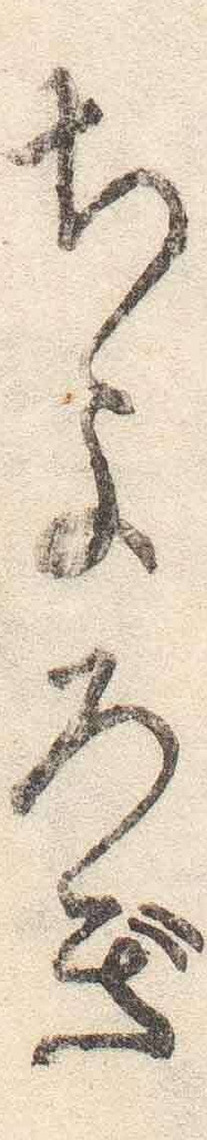ちよろぎ
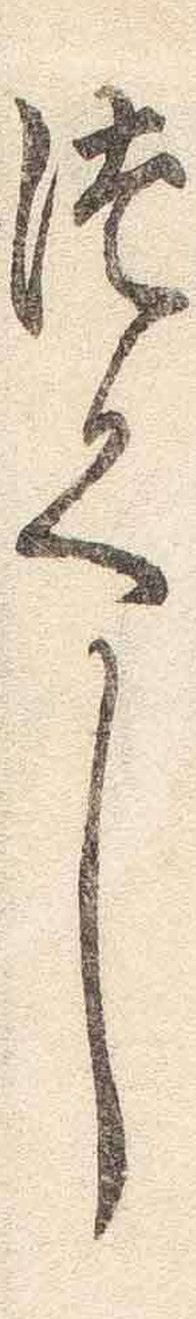つくし
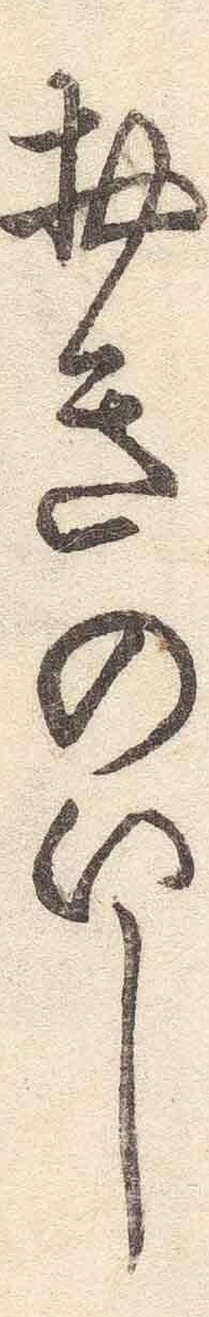おきのいし
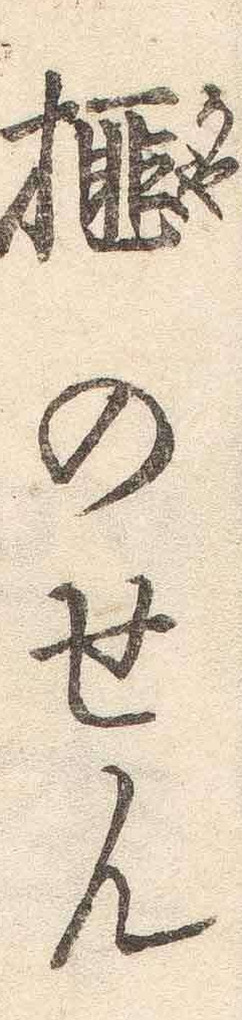榧のせん
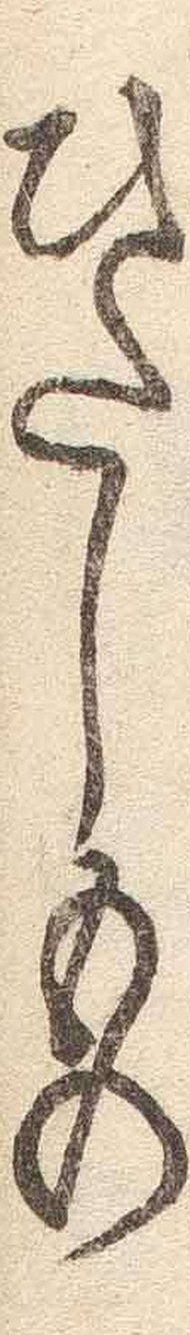ひたしもの
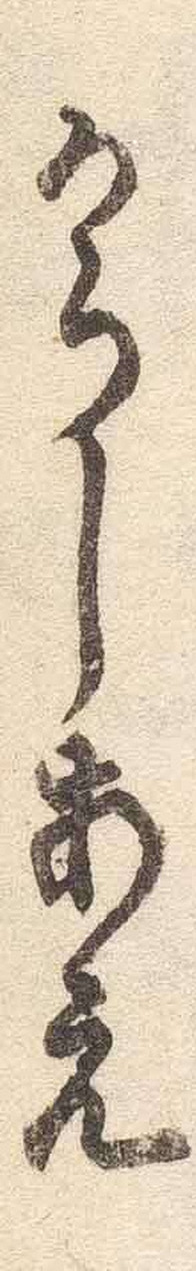からしあえ
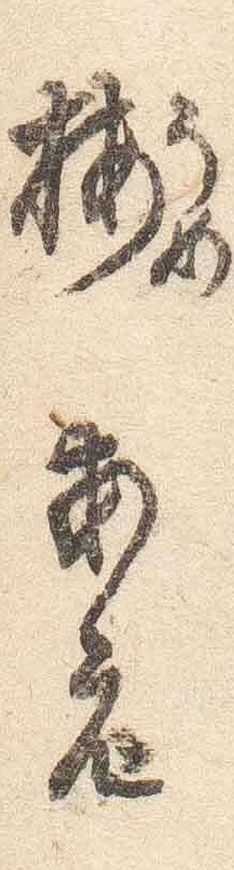梅あえ
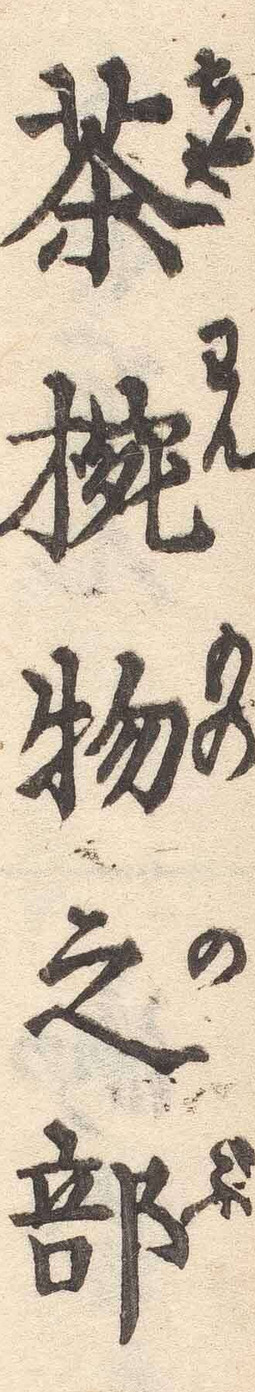茶碗物之部

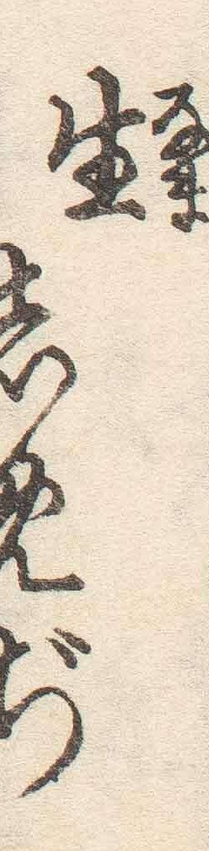麩しめぢ
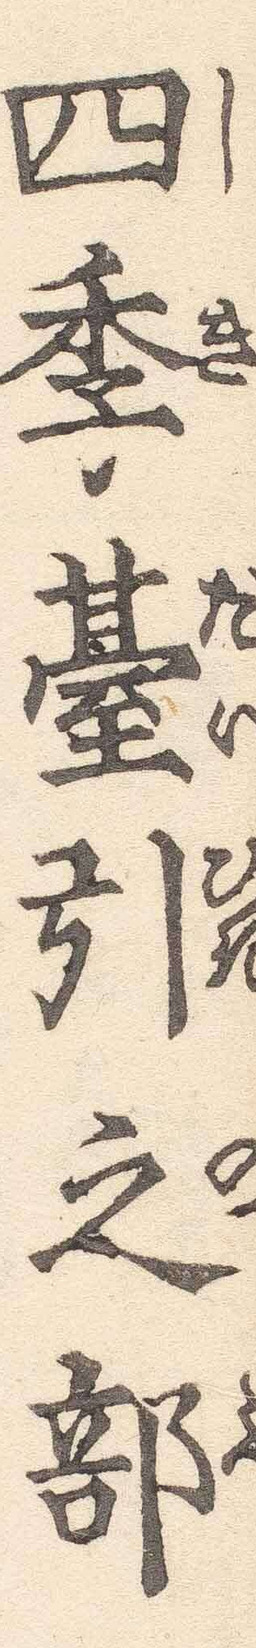四季台引之部
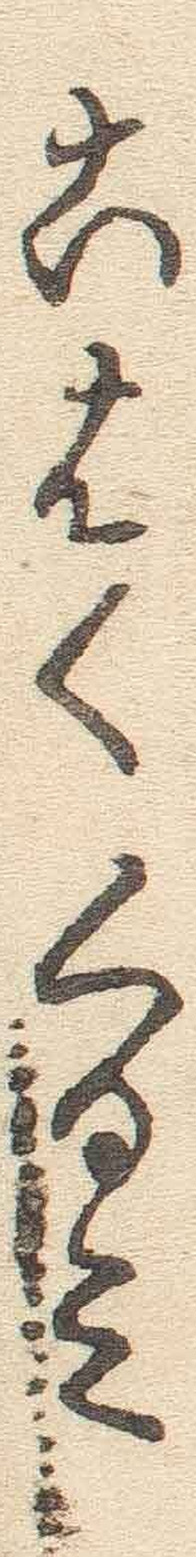こはくくるみ

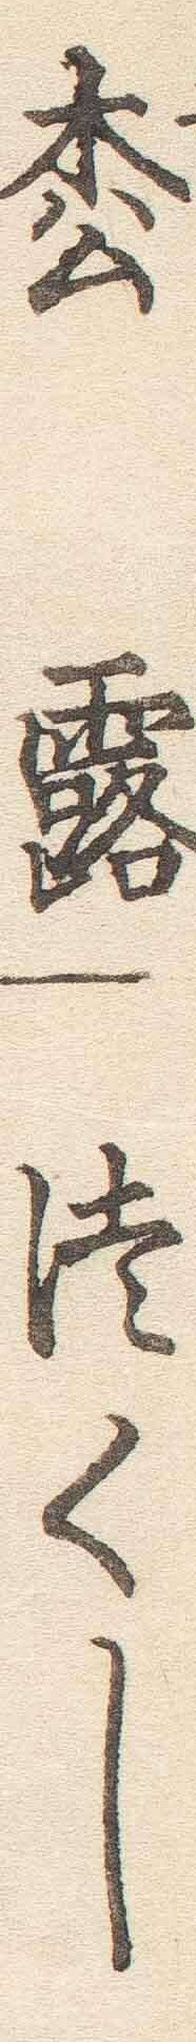松露つくし
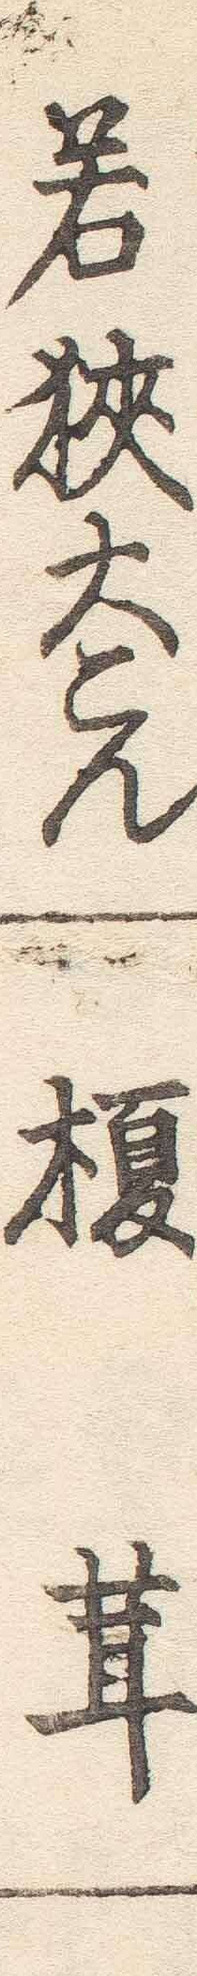若狭大こん榎茸
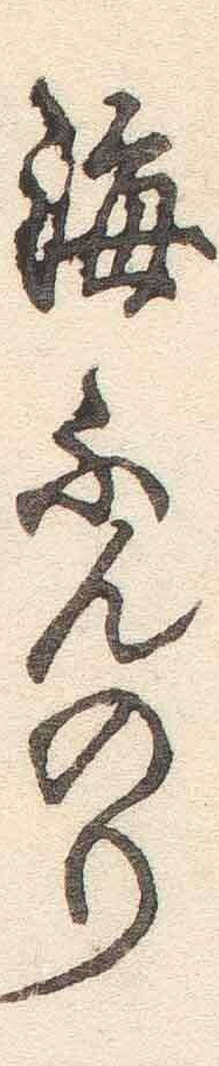海ふんのり
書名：料理通
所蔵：東京学芸大学附属図書館 国文学研究資料館
